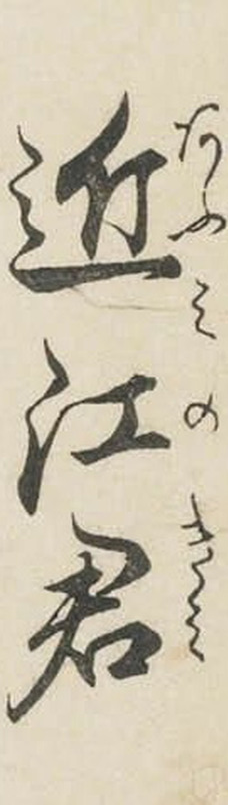近江君
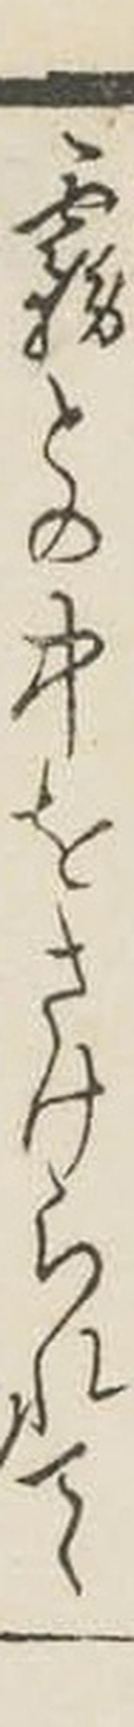霧との中をさけられて
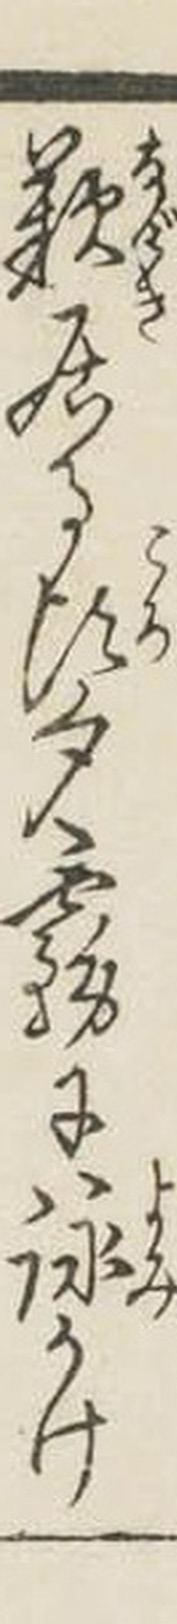歎居る頃夕霧に詠かけ
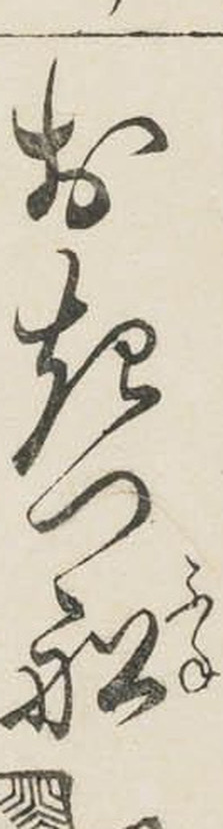おきつ船
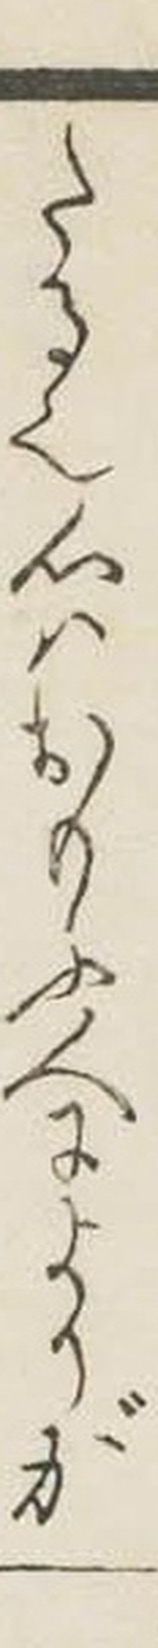たる也心はおもふ人によりが
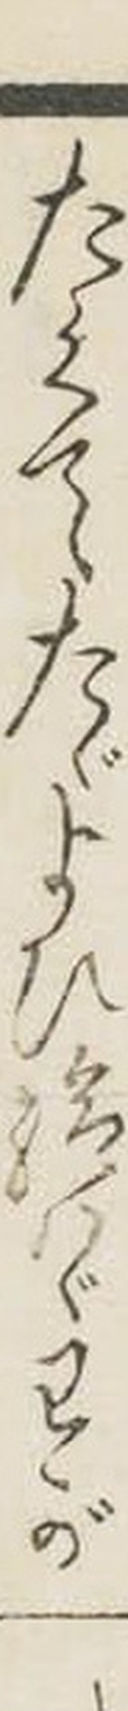たくてたゞよひ給はゞわが
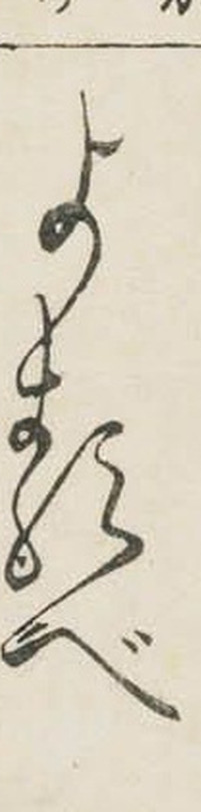よるべ
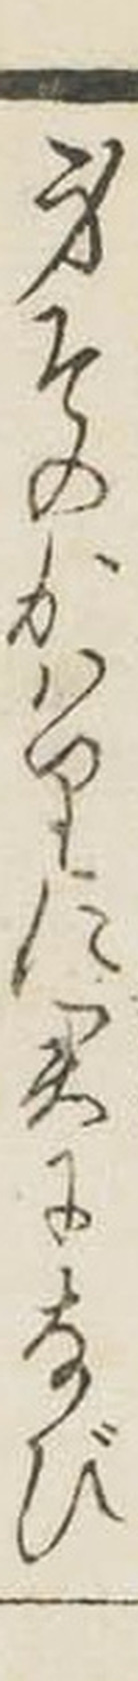身そのかはりに君になび
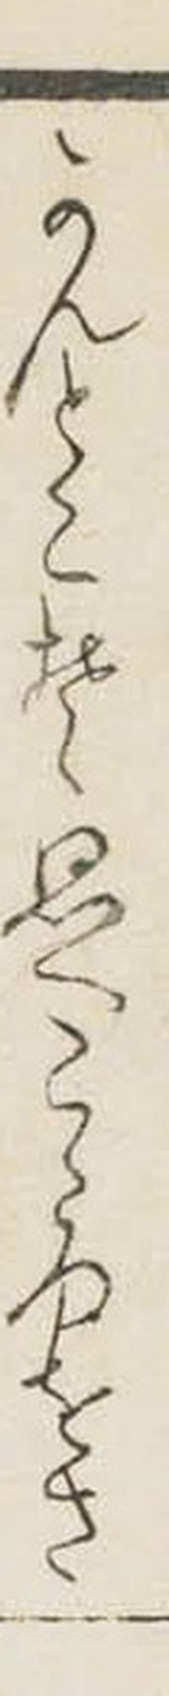かんとこそ思へこゝろをさ
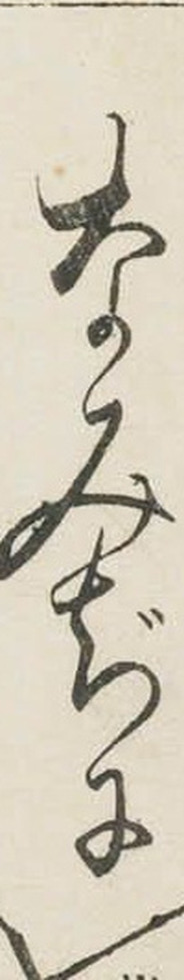なみぢに
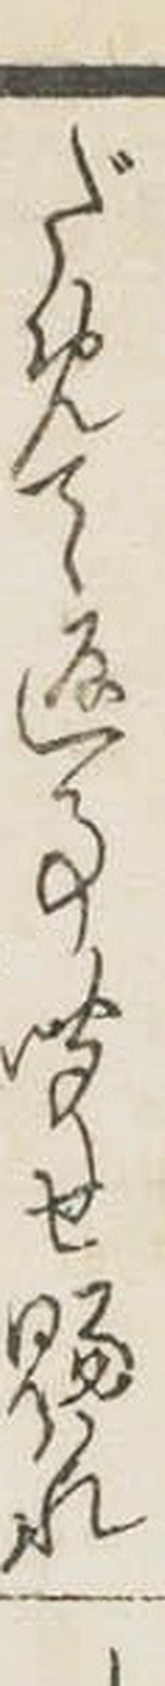だめて返事聞せ賜はれ
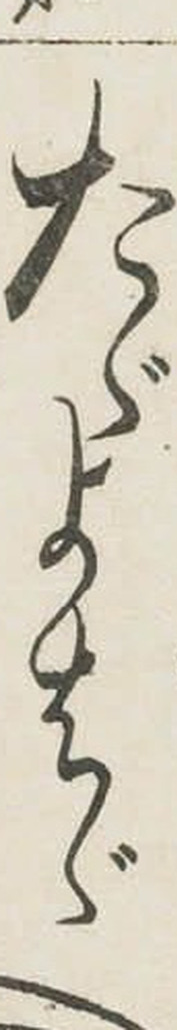たゞよはゞ
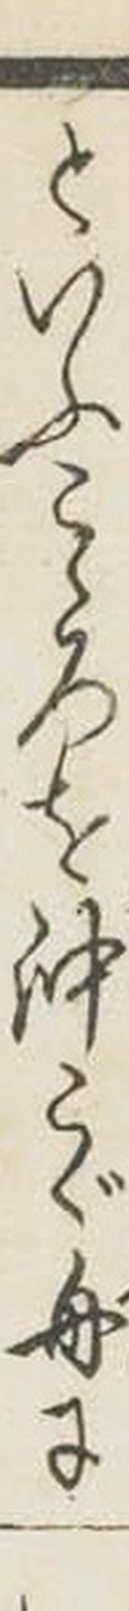といふこゝろを沖こぐ舟に
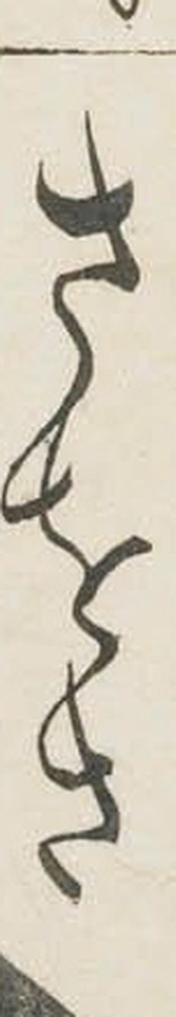さをさ
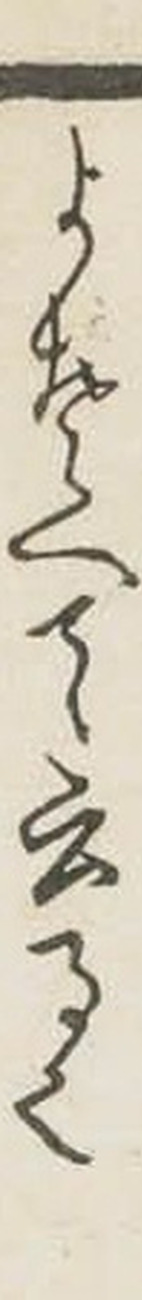よそへて云る也
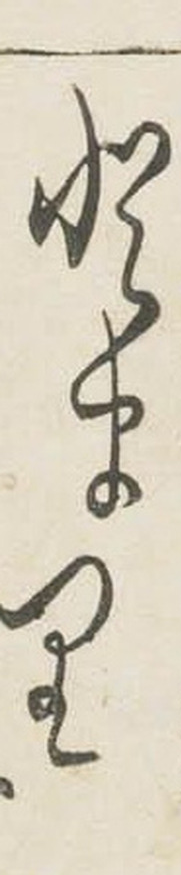とまり
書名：源氏百人一首
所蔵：東京学芸大学教育コンテンツアーカイブ
